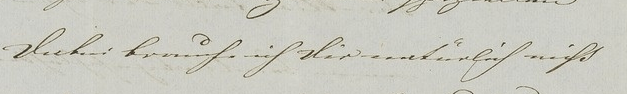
Dabei brauche ich Dir natürlich nicht
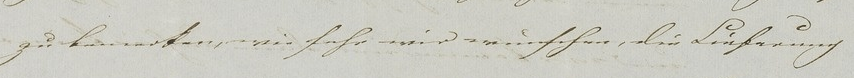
zu bemerken, wie sehr wir wünschen, die Lieferung
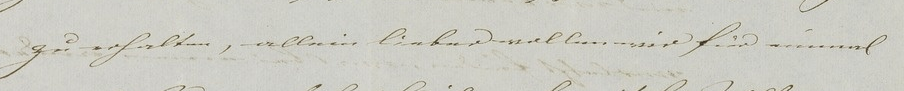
zu erhalten, allein lieber wollen wir für einmal
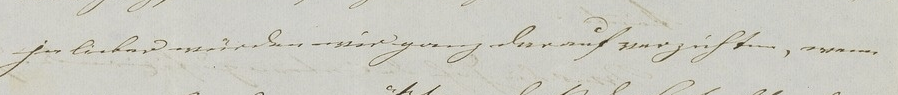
ja lieber würden wir ganz darauf verzichten, wenn
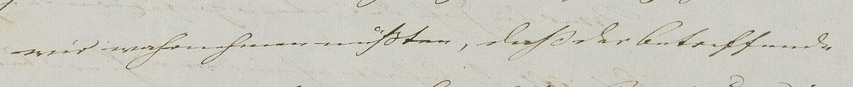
wir wahrnehmen müßten, daß der betreffende
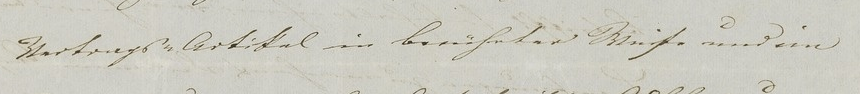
Vertrags-Artikel in berührter Weise und im
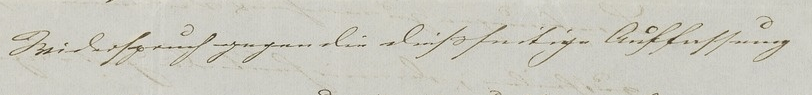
Widerspruch gegen die dießseitige Auffassung
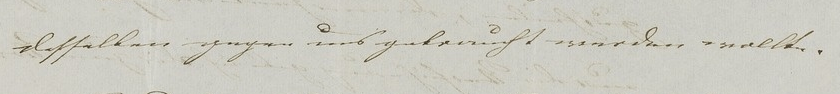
desselben gegen uns gebraucht werden wollte.
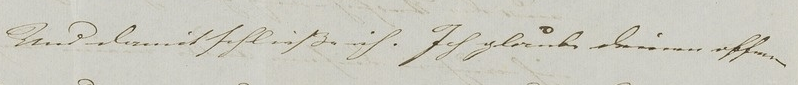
Und damit schließe ich. Ich glaube deinen offenen
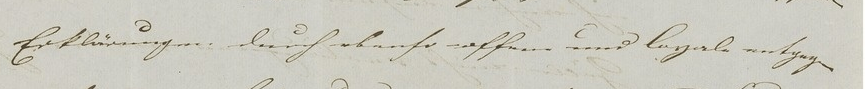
Erklärungen durch ebenso offene und loyale entgegen
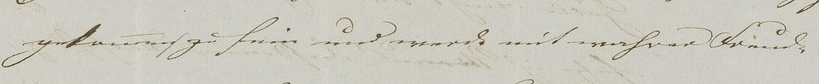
gekommen zu sein und werde mit wahrer Freude
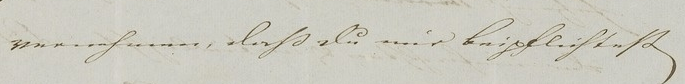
vernehmen, daß Du mir beipflichtest
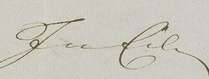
In Eile
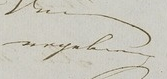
ergebener
